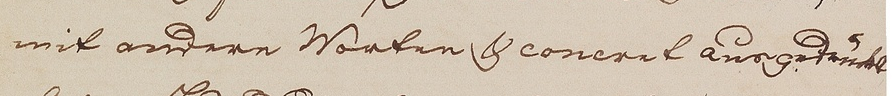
mit andern Worten & concret ausgedrückt
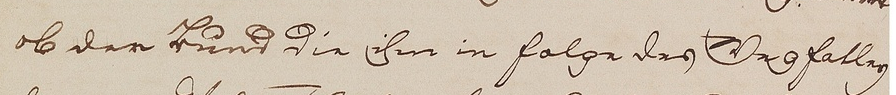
ob der Bund die ihm in Folge des Wegfalles
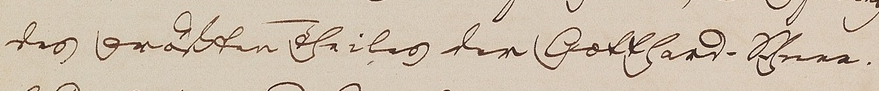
des größten Theiles der Gotthard-Schnee-
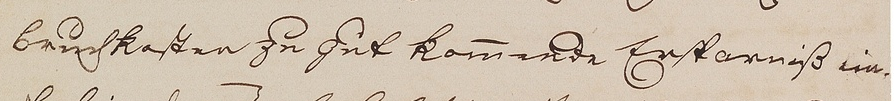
bruchkosten zu gut kommende Ersparniß ein-
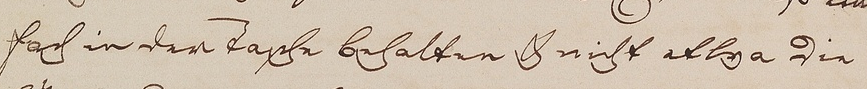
fach in der Tasche behalten & nicht etwa die
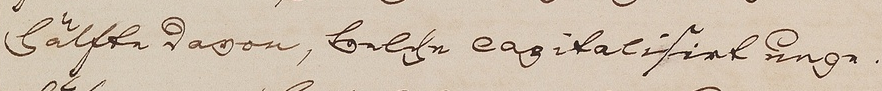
Hälfte davon, welche capitalisirt unge-
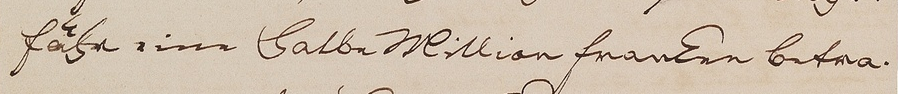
fähr eine halbe Million Franken betra-
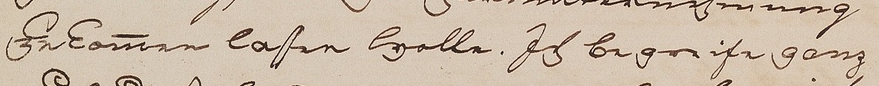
zukommen lassen wolle. Ich begreife ganz
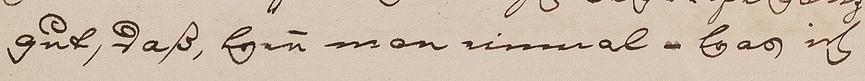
gut, daß, wenn man einmal – was ich
